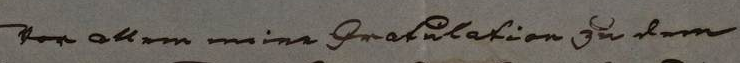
Vor allem meine Gratulation zu dem
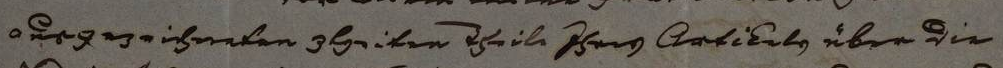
ausgezeichneten zweiten Theile Ihres Artikels über die
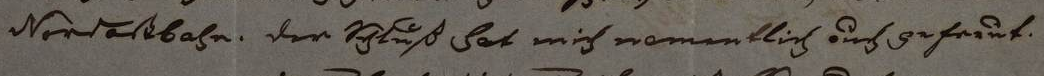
Nordostbahn. Der Schluß hat mich namentlich auch gefreut.
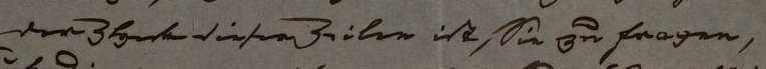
Der Zweck dieser Zeilen ist, Sie zu fragen,
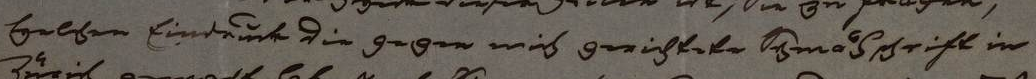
welchen Eindruck die gegen mich gerichtete Schmähschrift in
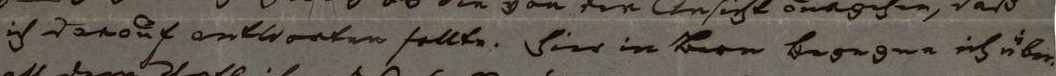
ich darauf antworten sollte. Hier in Bern begegne ich über-
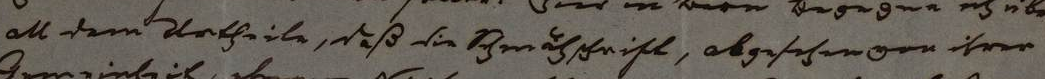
all dem Urtheile, daß die Schmähschrift, abgesehen von ihrer
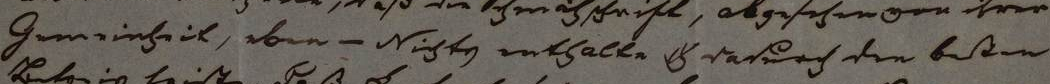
Gemeinheit, eben – Nichts enthalte & dadurch den besten
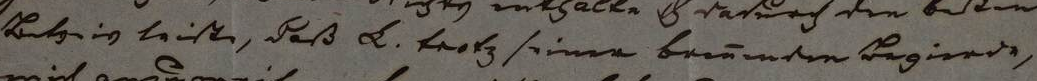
Beweis leiste, daß L. trotz seiner brennenden Begierde,
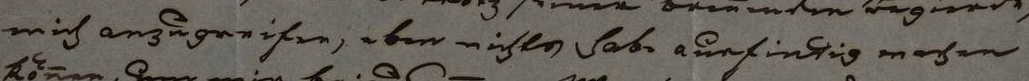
mich anzugreifen, eben nichts habe ausfindig machen
